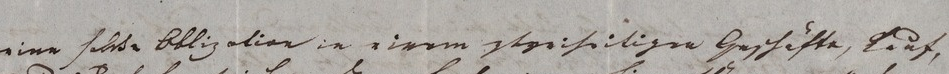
eine solche Obligation in einem zweiseitigen Geschäfte, Kauf,
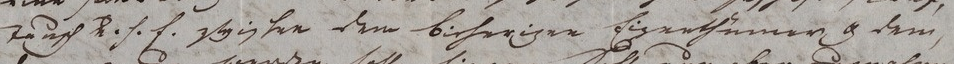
Tausch u. s. f. zwischen dem bisherigen Eigenthümer & dem,
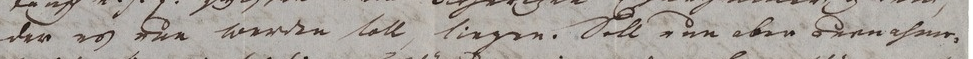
der es nun werden soll liegen. Soll nun aber ausnahms-
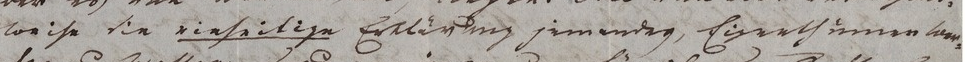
weise die einseitige Erklärung jemandes, Eigenthümer wer-
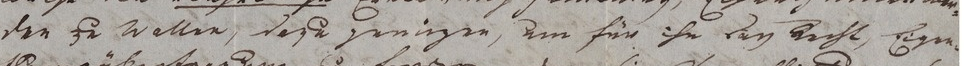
den zu wollen, dazu genügen, um für ihn das Recht, Eigen-
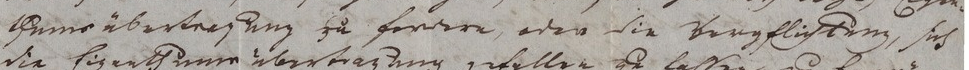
thumsübertragung zu fordern, oder die Verpflichtung, sich
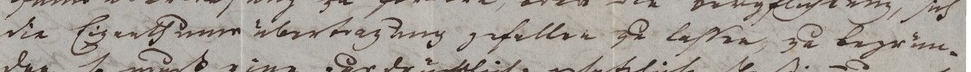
die Eigenthumsübertragung gefallen zu lassen, zu begrün-
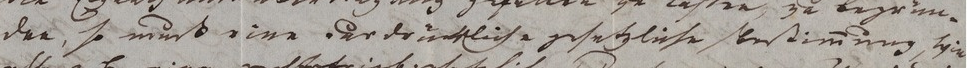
den, so muß eine ausdrückliche gesetzliche Bestimmung, wie
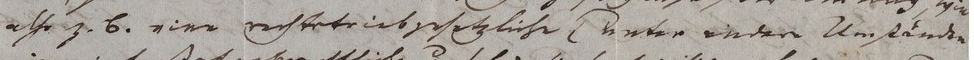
also z. B. eine rechtstriebgesetzliche (unter andern Umständen
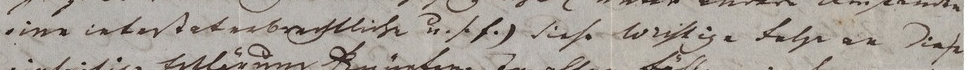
eine intestat erbrechtliche u. s. f.) diese wichtige Folge an diese
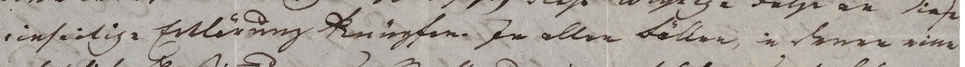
einseitige Erklärung knüpfen. In alten Fällen, in denen eine
